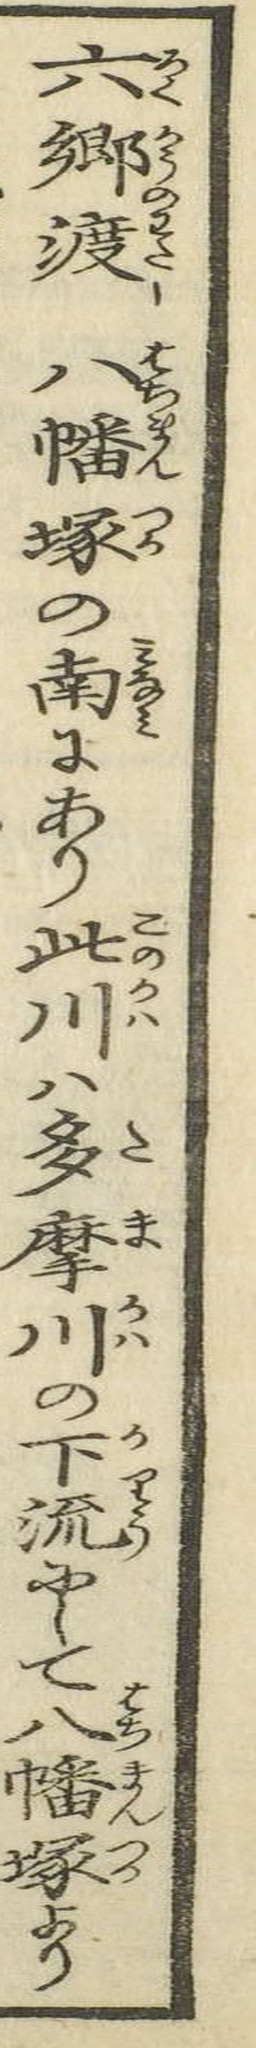六郷渡八幡塚の南にあり此川は多摩川の下流にして八幡塚より
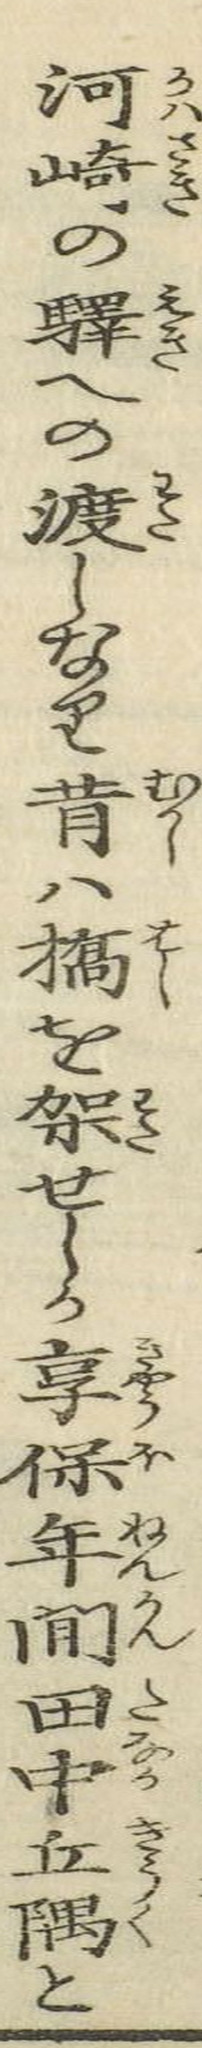河崎の驛への渡しなり昔は橋を架せしか享保年間田中丘隅と
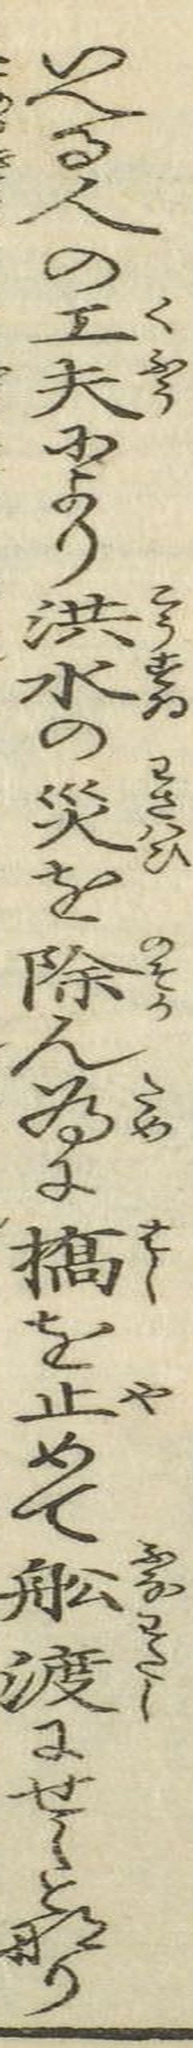いへる人の工夫により洪水の災を除ん為に橋を止めて舩渡にせしとなり
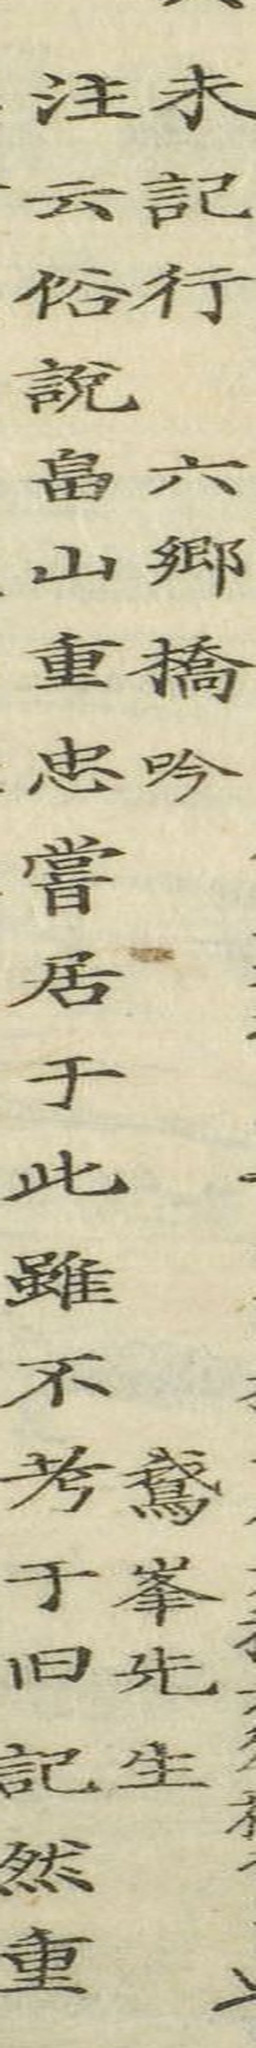注云俗說畠山重忠嘗居于此雖不考于旧記然重
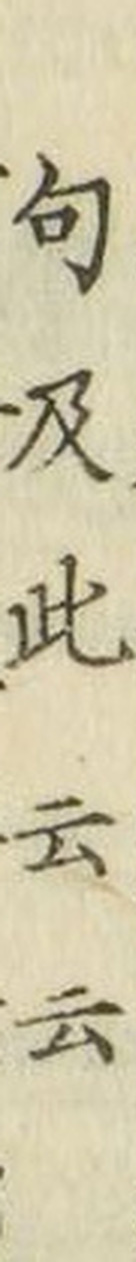句及此云云
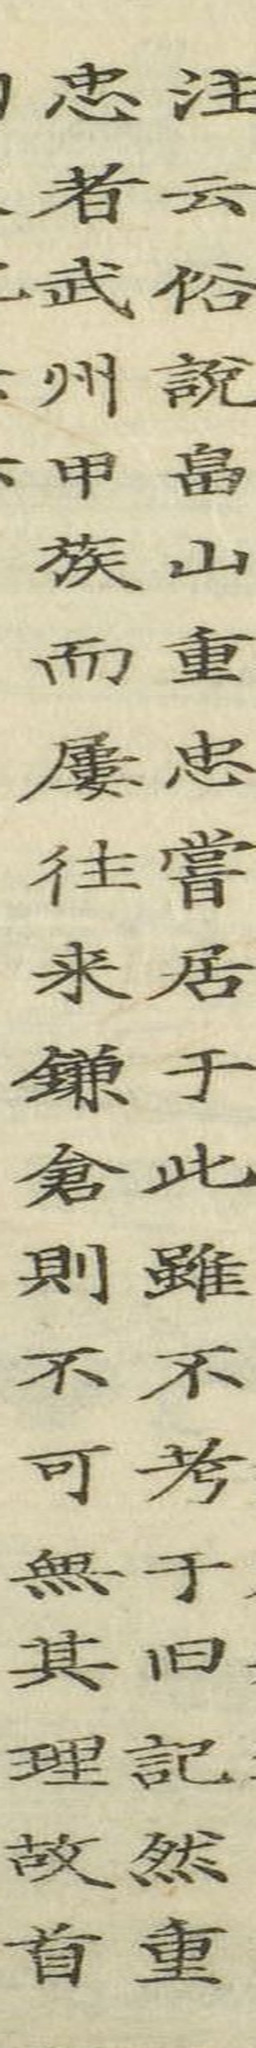忠者武州甲族而屢往来鎌倉則不可無其理故首
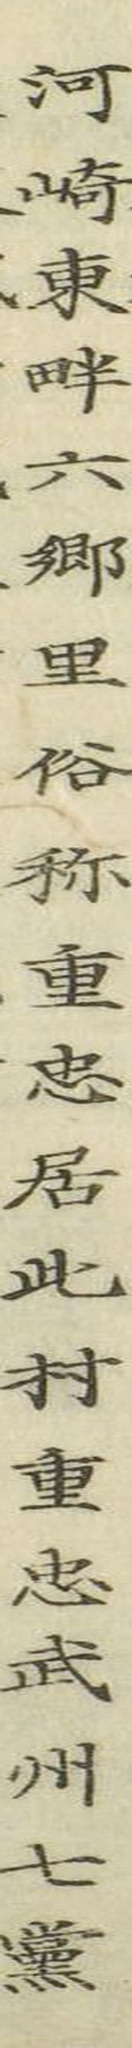河崎東畔六郷里俗称重忠居此村重忠武州七黨
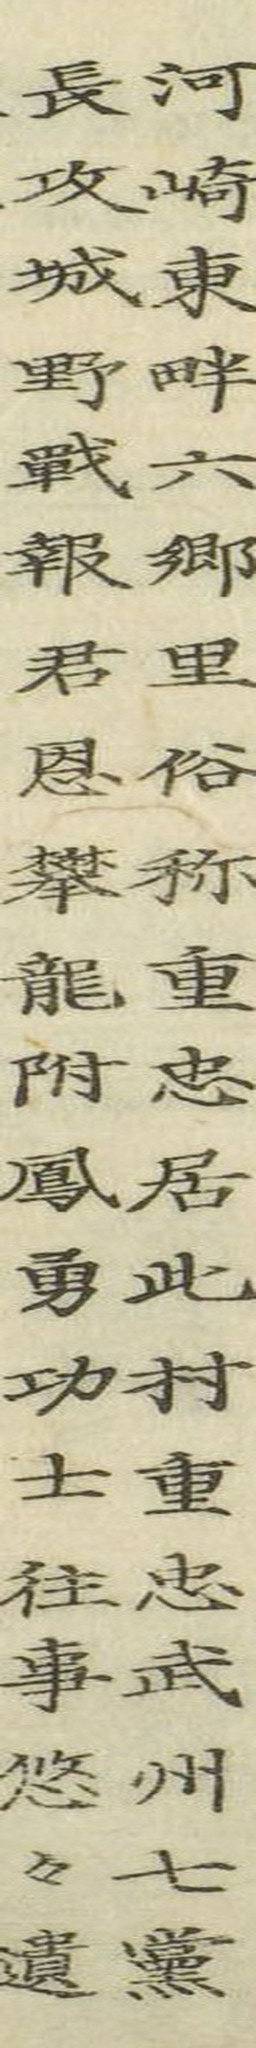長攻城野戰報君恩攀龍附鳳勇功士往事悠々遺
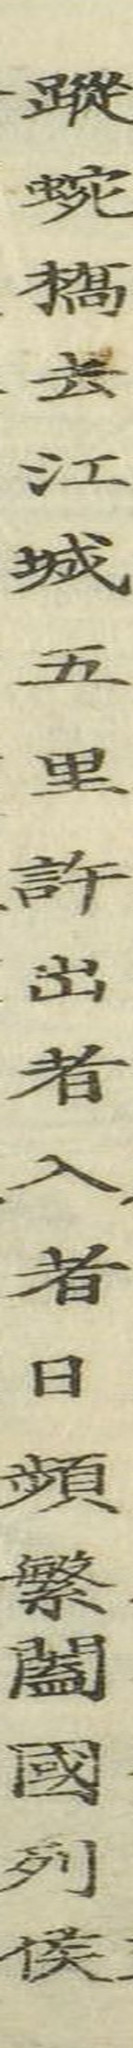蹤蜿橋去江城五里許出者入者日頻繁闔國列侯
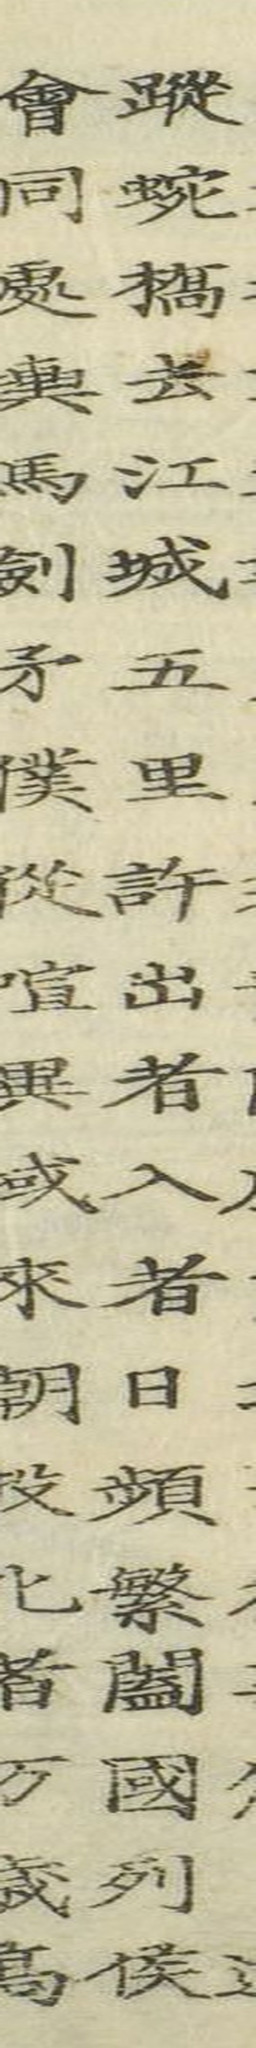會同處輿馬劍矛僕從喧異域來朝投化者万歳髙
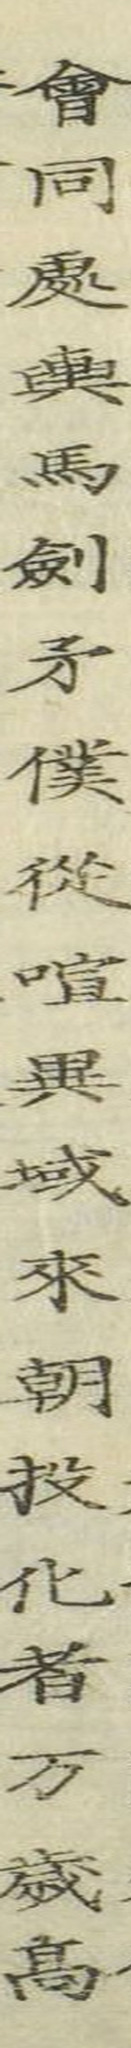會同處輿馬劍矛僕從喧異域來朝投化者万歳髙
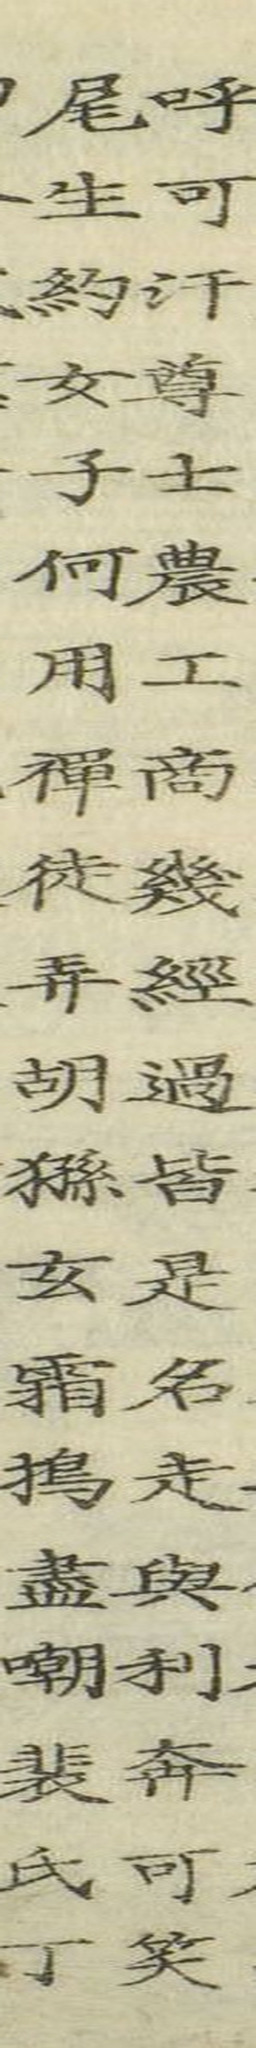尾生約女子何用禪徒弄胡猻玄霜搗盡嘲裴氏丁
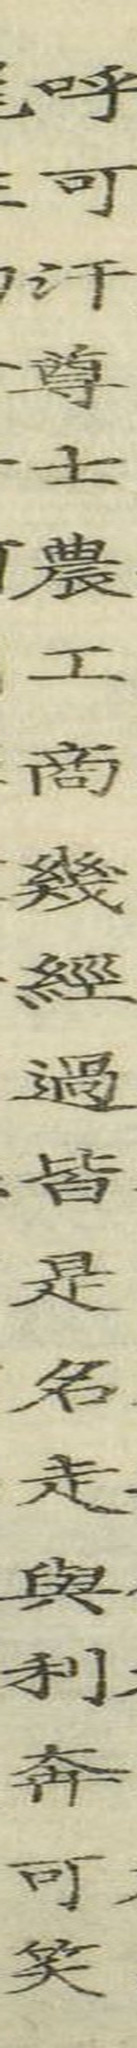呼可汗尊士農工商幾經過皆是名走與利奔可笑
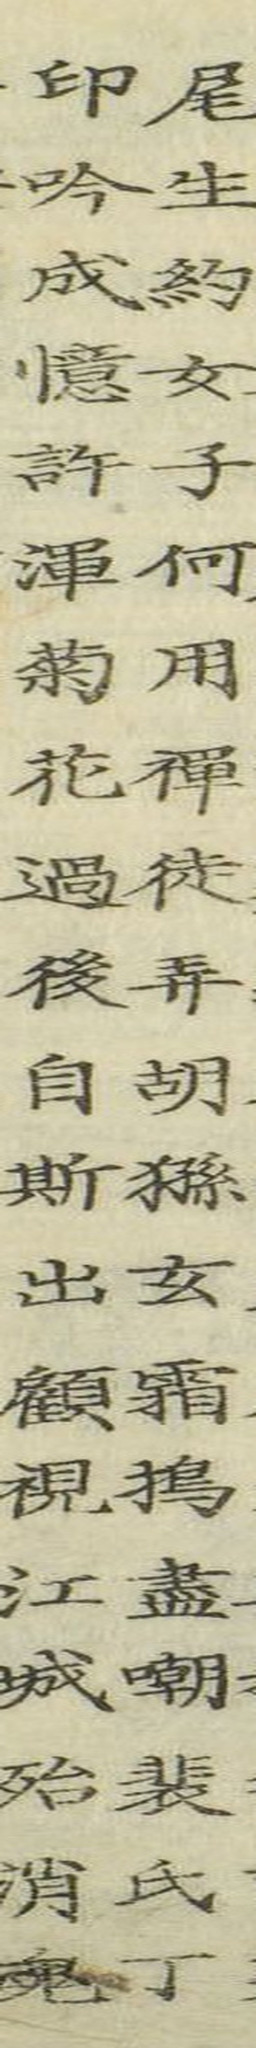印吟成憶許渾菊花過後自斯出顧視江城殆消魂
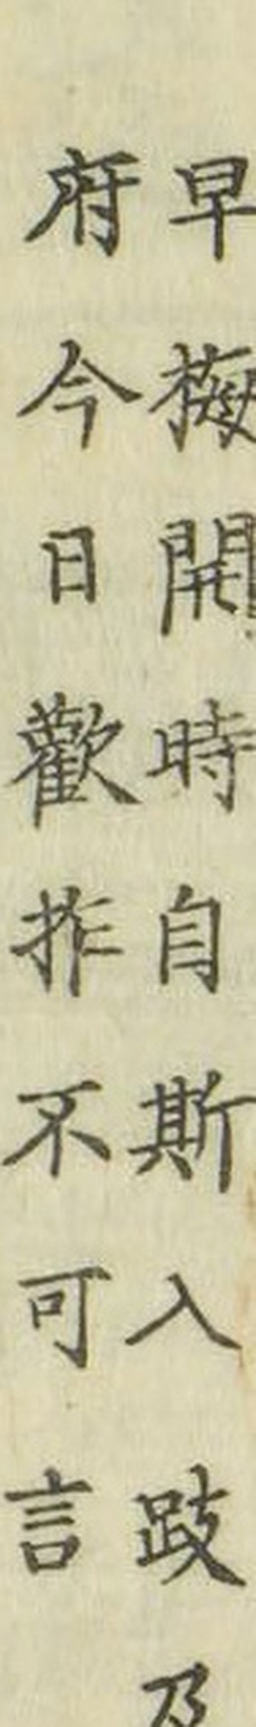府今日歡拃不可言
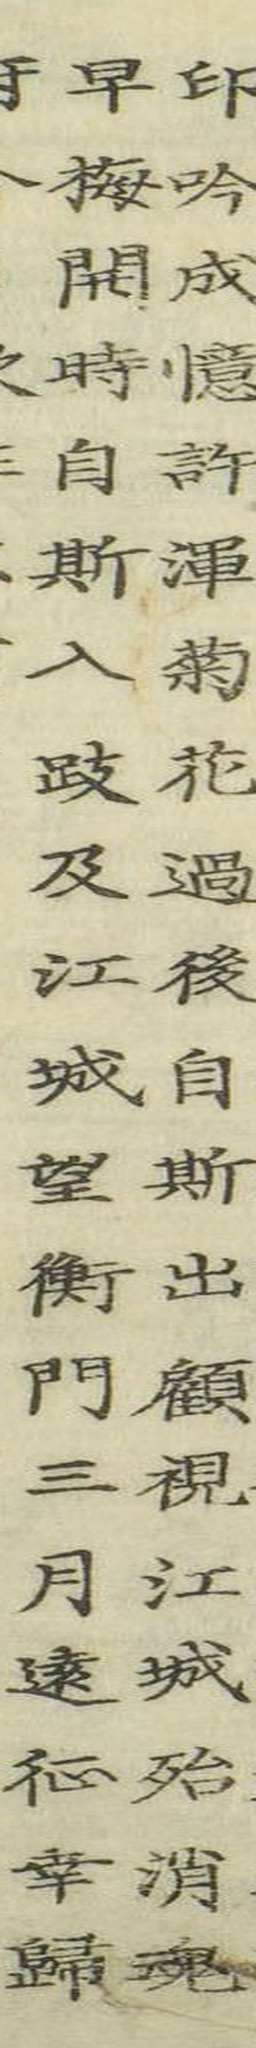早梅開時自斯入跂及江城望衡門三月遠征幸歸
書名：江戸名所図会 20巻 巻之4
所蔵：東京学芸大学教育コンテンツアーカイブ
